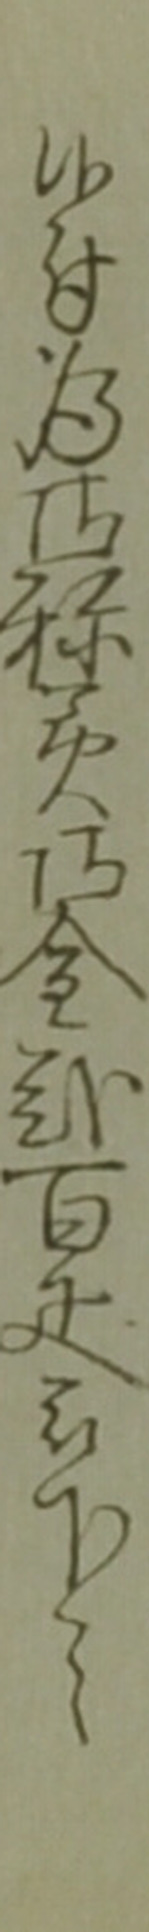候付為御称美御金弐百疋被下之
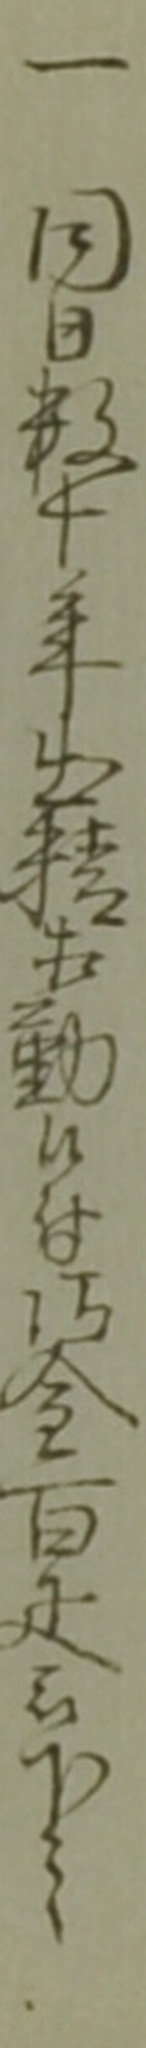一同日数十年出精相勤候付御金百疋被下之
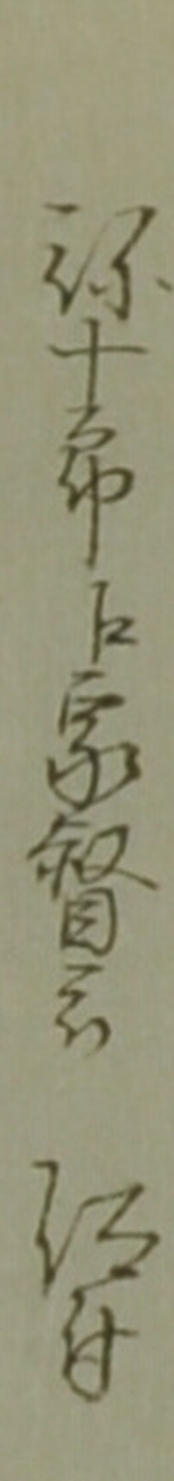弥十郎江家督被仰付
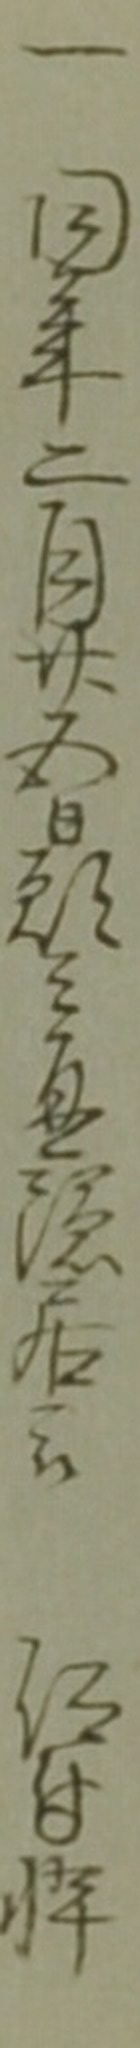一同年二月廿五日願之通隠居被仰付忰
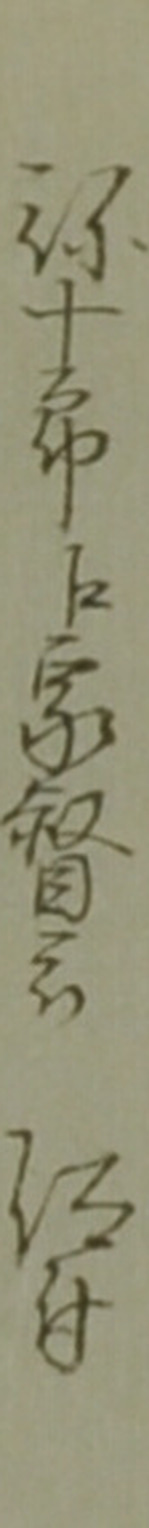弥十郎江家督被仰付
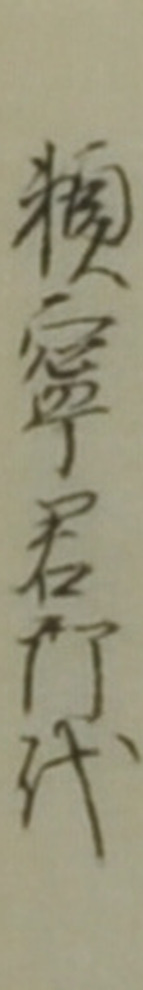頼寧君御代
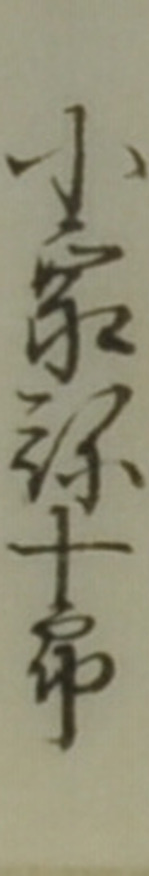小泉弥十郎
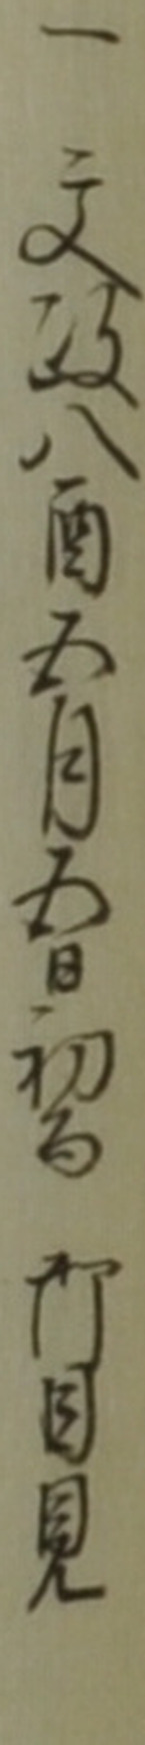一文政八酉五月五日初而御目見
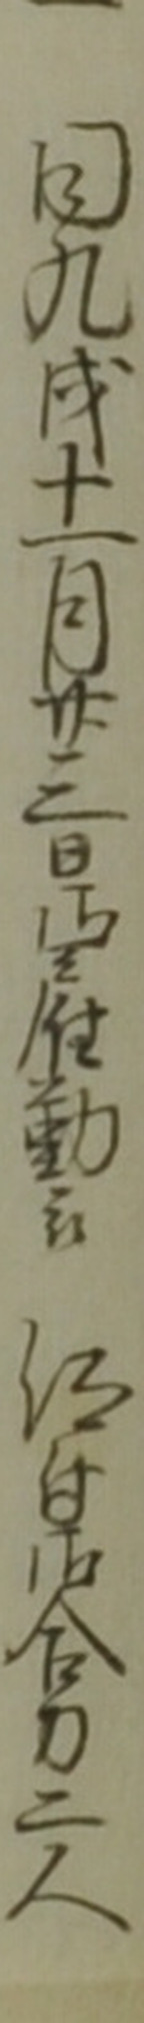一同九戌十一月廿三日御雇勤被仰付御合力二人
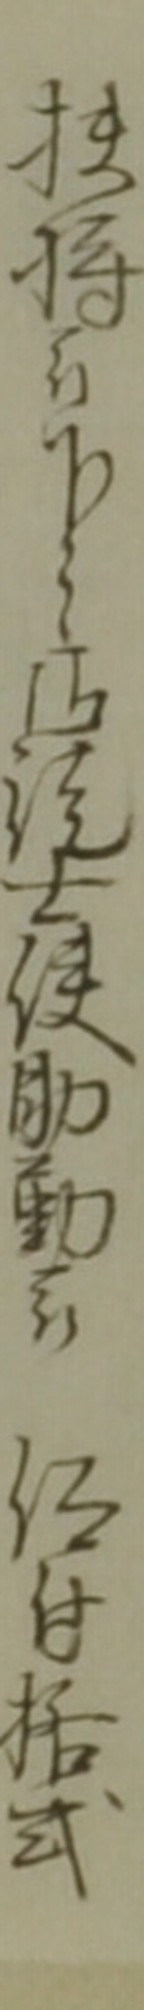扶持被下之御徒士使助勤被仰付格式
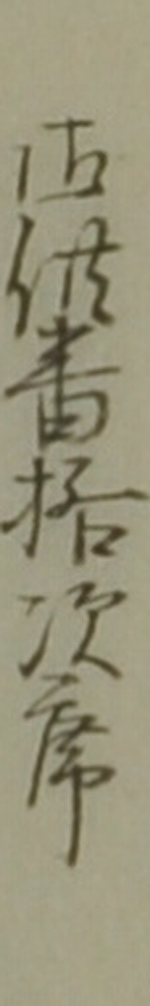御供番格次席
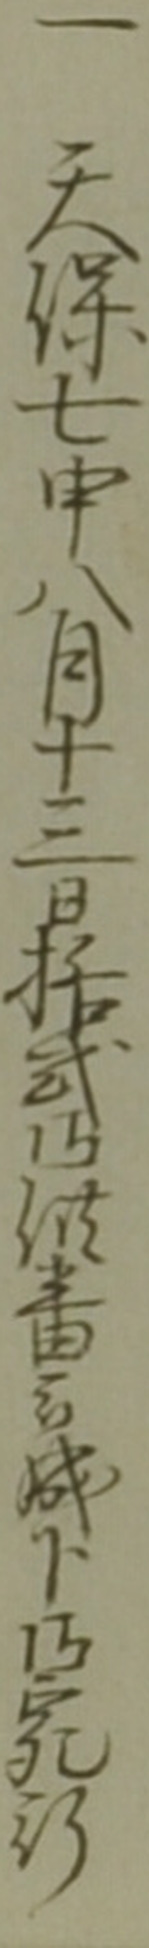一天保七申八月十三日格式御供番被成下御宛行
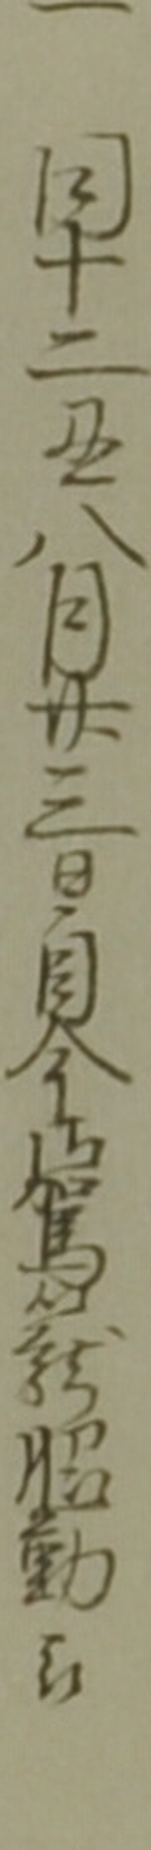一同十二丑八月廿三日自今御駕籠脇勤被
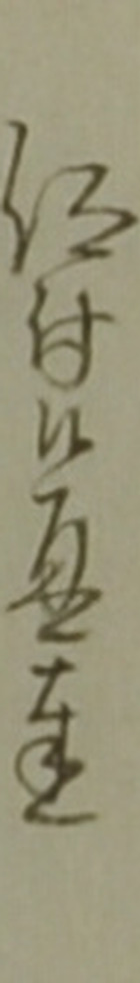仰付候通達
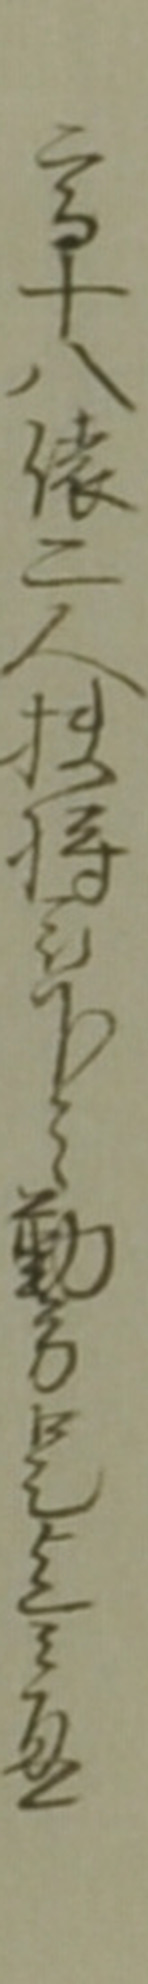高十八俵二人扶持被下之勤方是迄之通
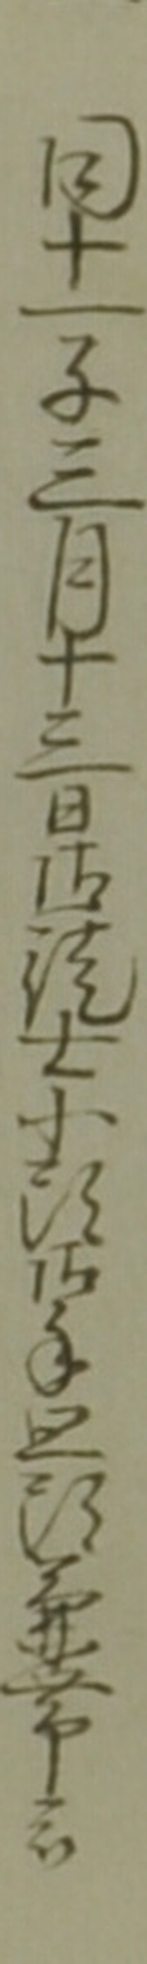一同十一子三月十三日御徒士小頭御手廻頭兼帯被
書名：無足諸士勤仕録（一）
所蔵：伊那市立高遠町図書館・合同会社AMANE
